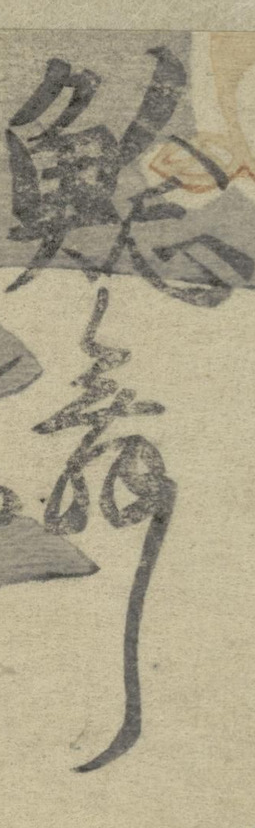鯰舞し
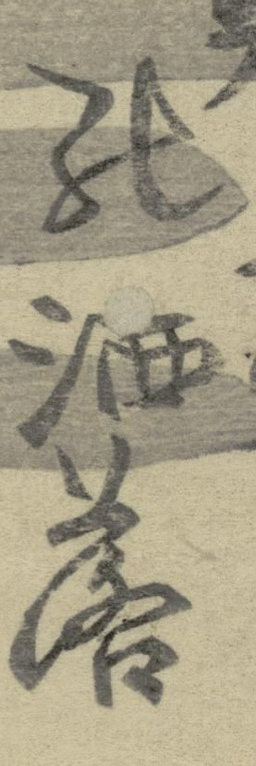の洒落
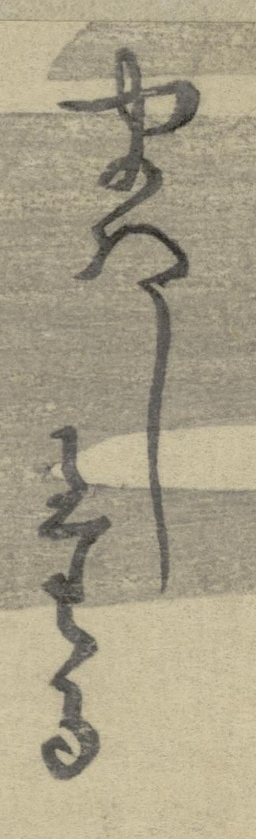まはしたる
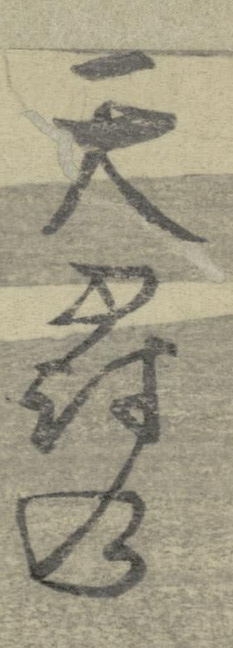天罰の
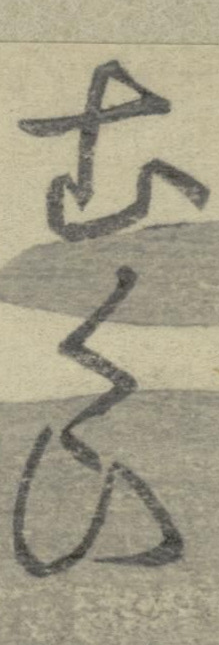むくい
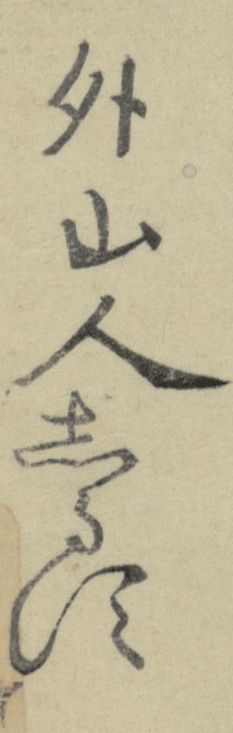外山人しるす
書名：鯰舞しの洒落
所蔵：東京大学地震研究所図書室 Earthquake Research Institute Library, The University of Tokyo, JAPAN
